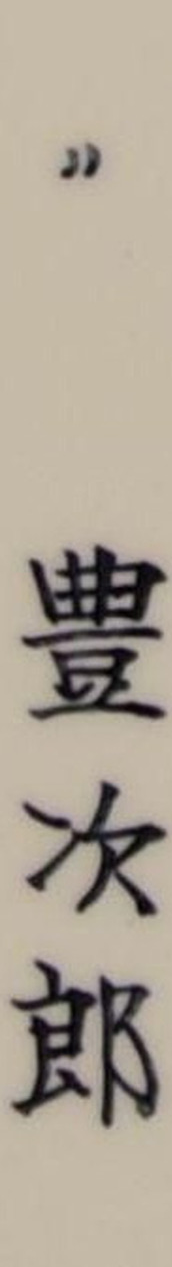豊次郎
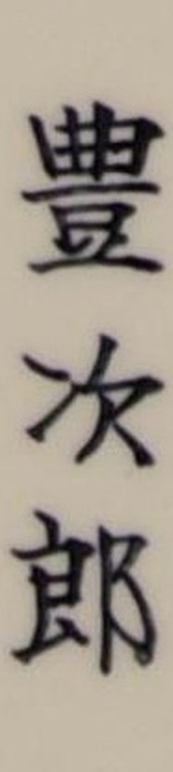豊次郎
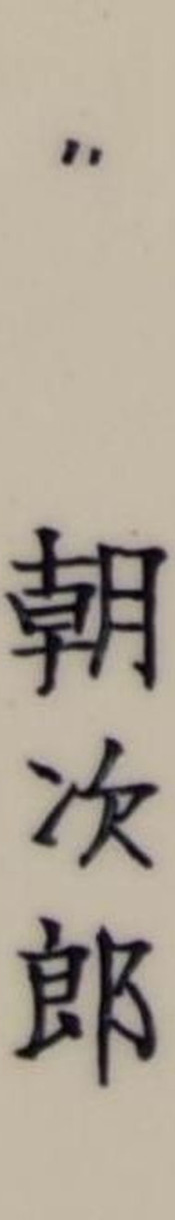朝次郎
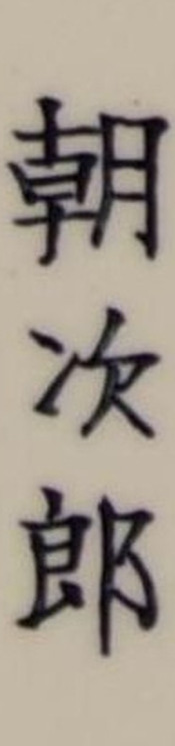朝次郎
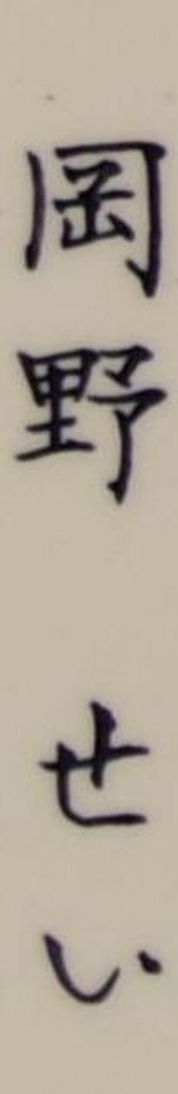岡野せい

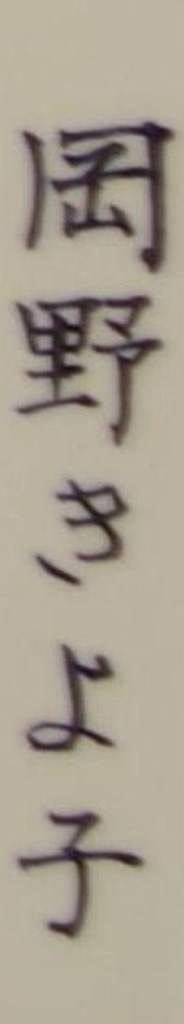岡野きよ子
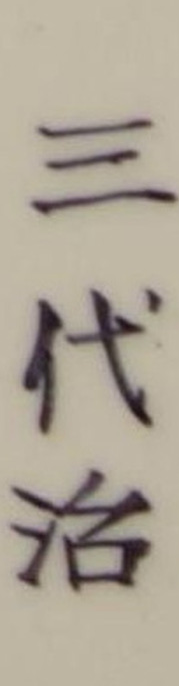三代治
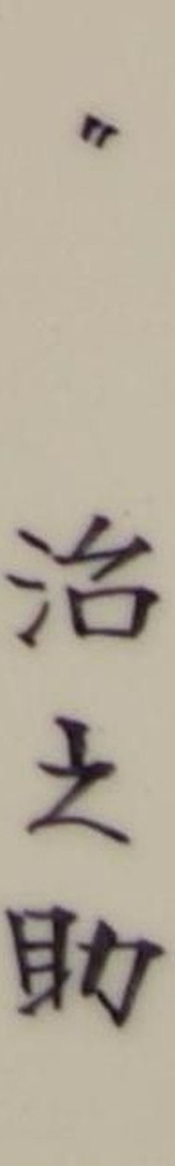治之助
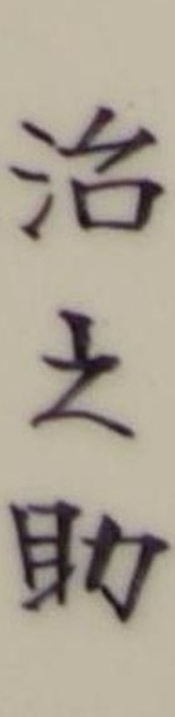治之助
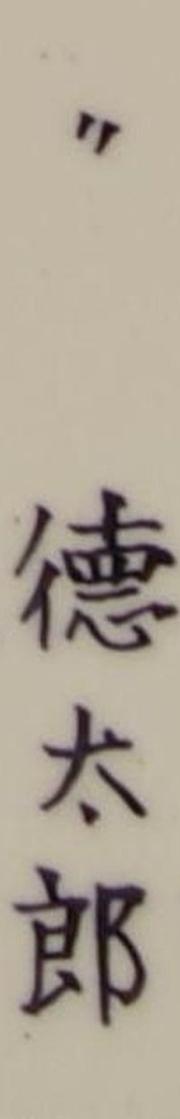徳太郎
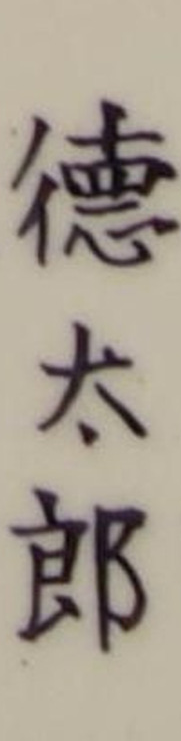徳太郎
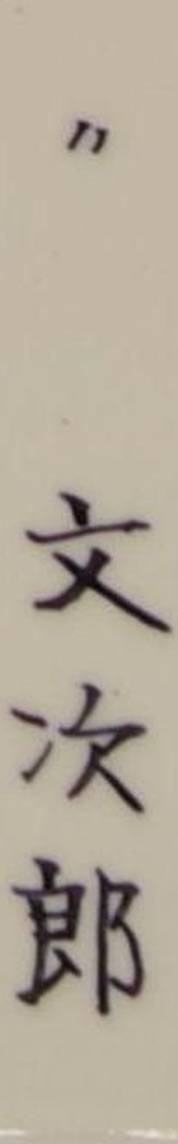文次郎
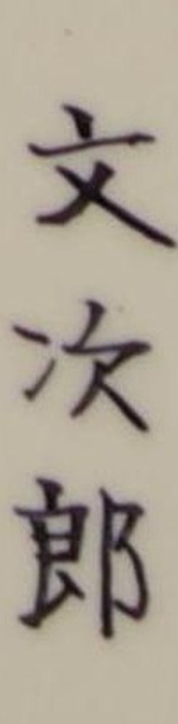文次郎
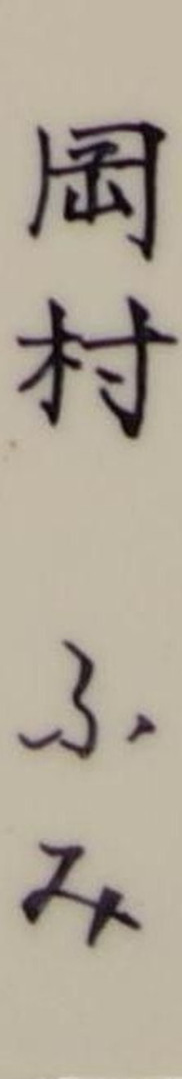岡村ふみ
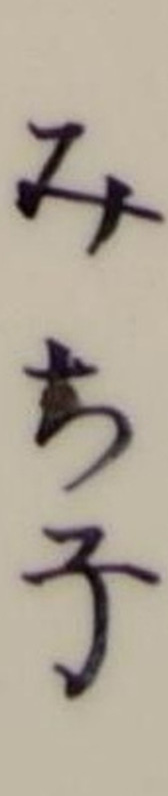みち子
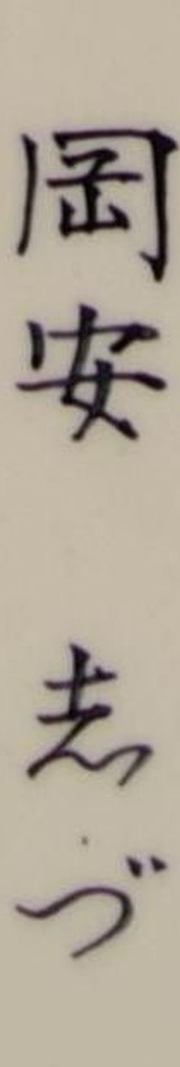岡安しづ
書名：E~L
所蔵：高野山金剛峯寺
